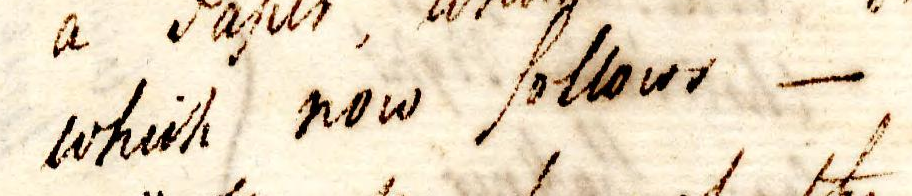which now follows –
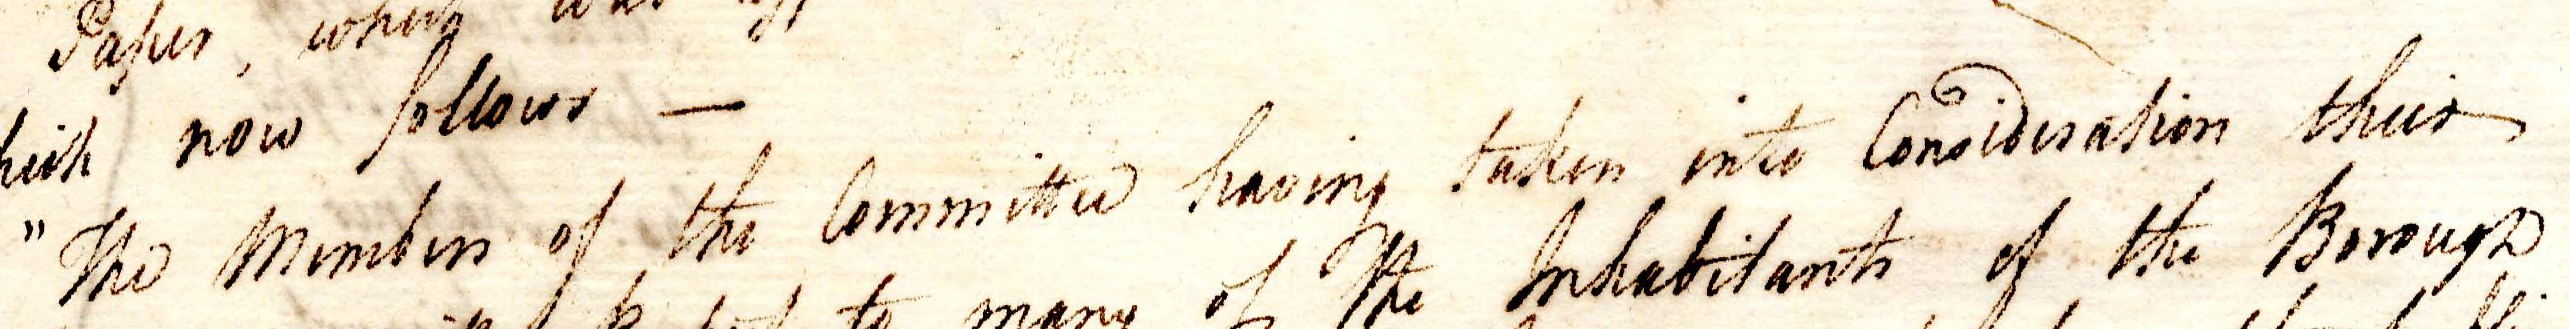The Members of the Committee having taken into Consideration their
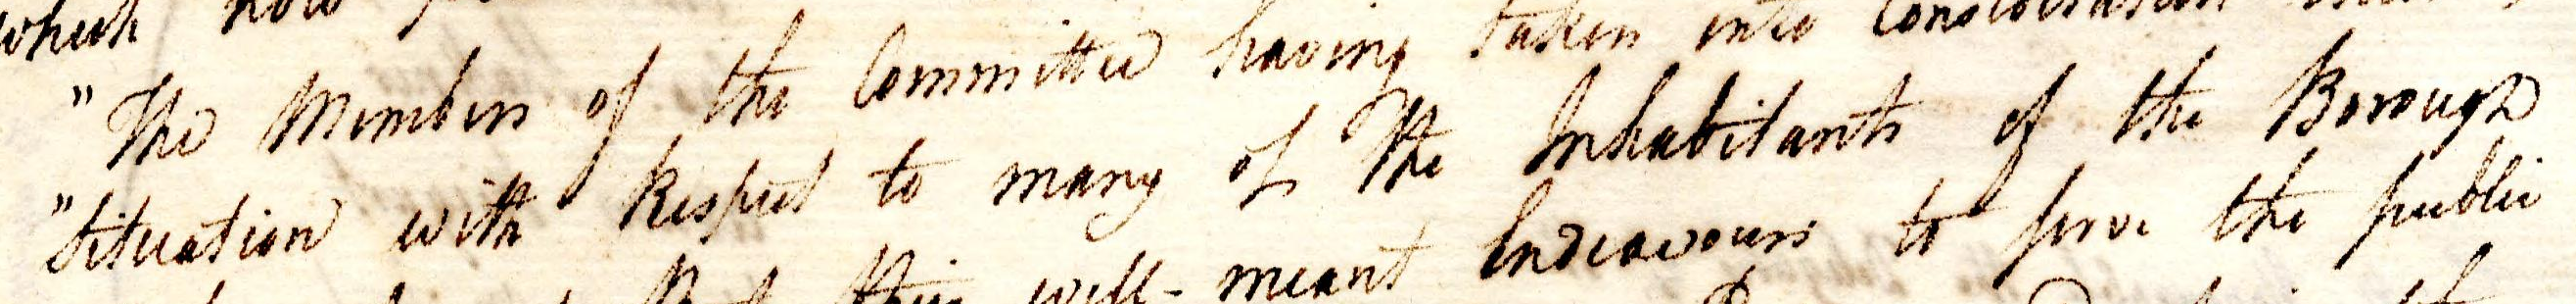"Situation with Respect to many of the Inhabitants of the Borough
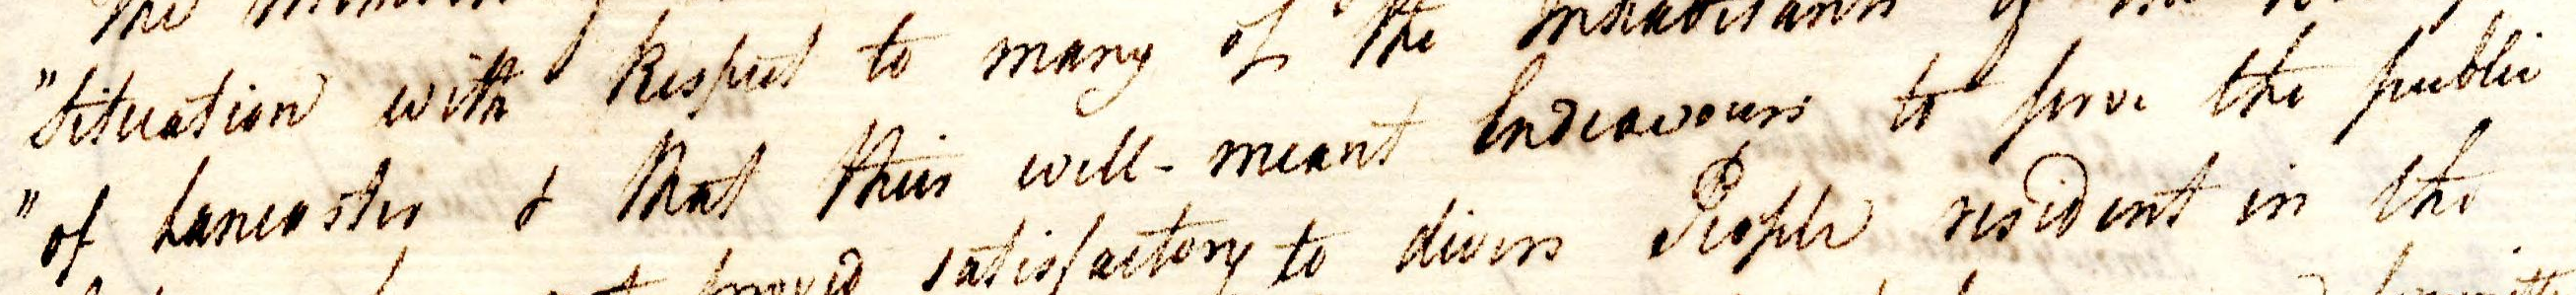"of Lancaster & that their well-meant Endeavours to serve the public
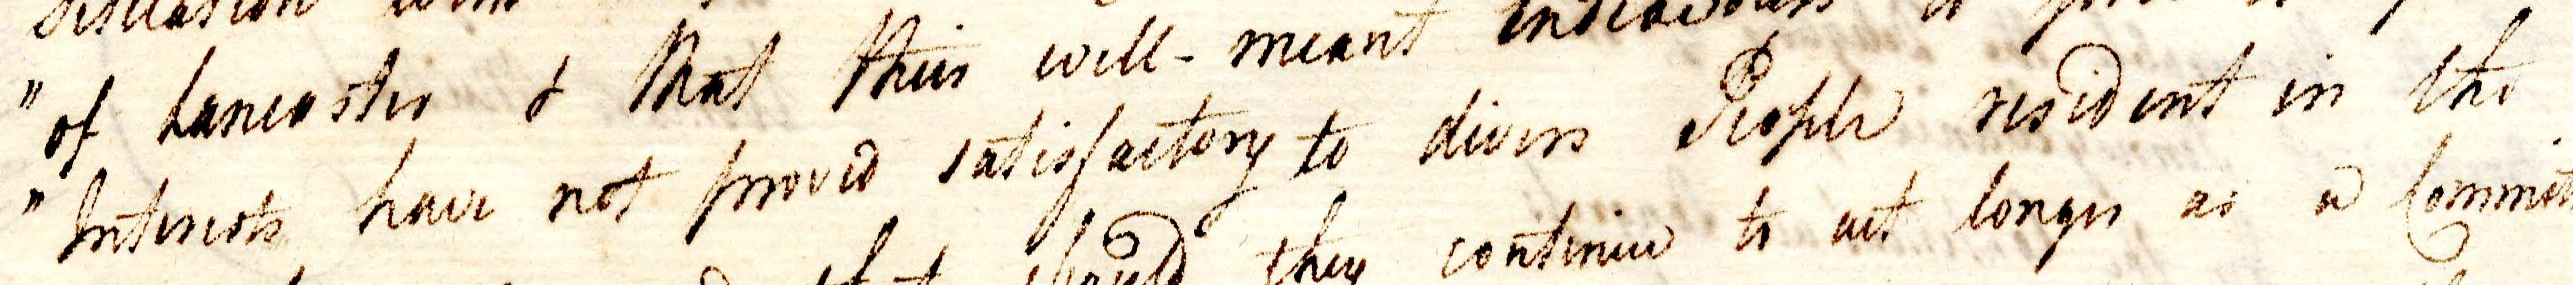"Interests have not proved satisfactory to divers People resident in the
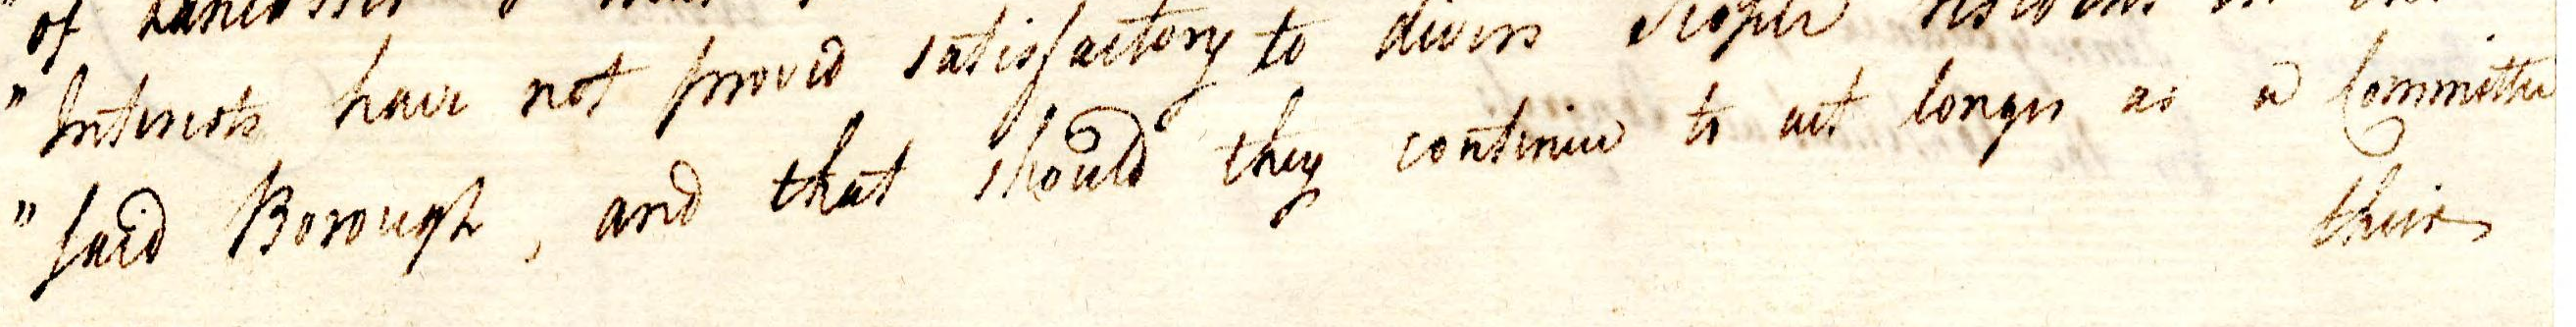"said Borough, and that should they continue to act longer as a Committee
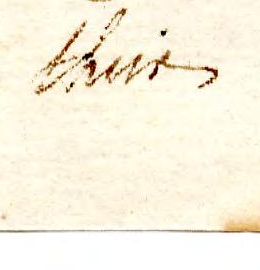their
